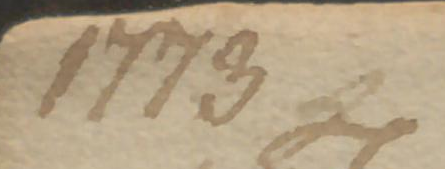1773
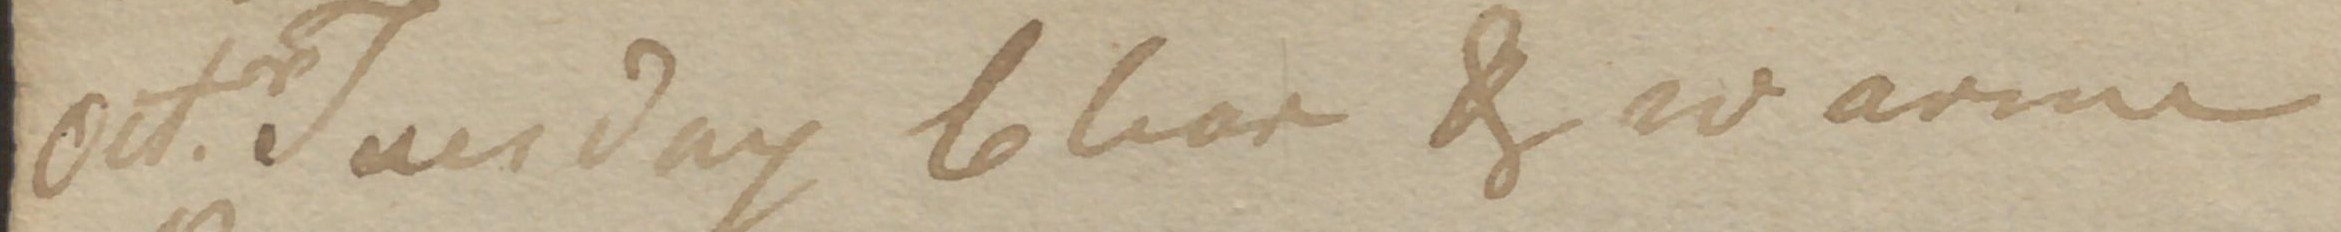Oct^r. Tuesday Clear & warme
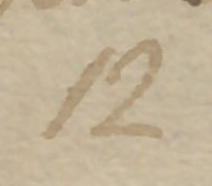12
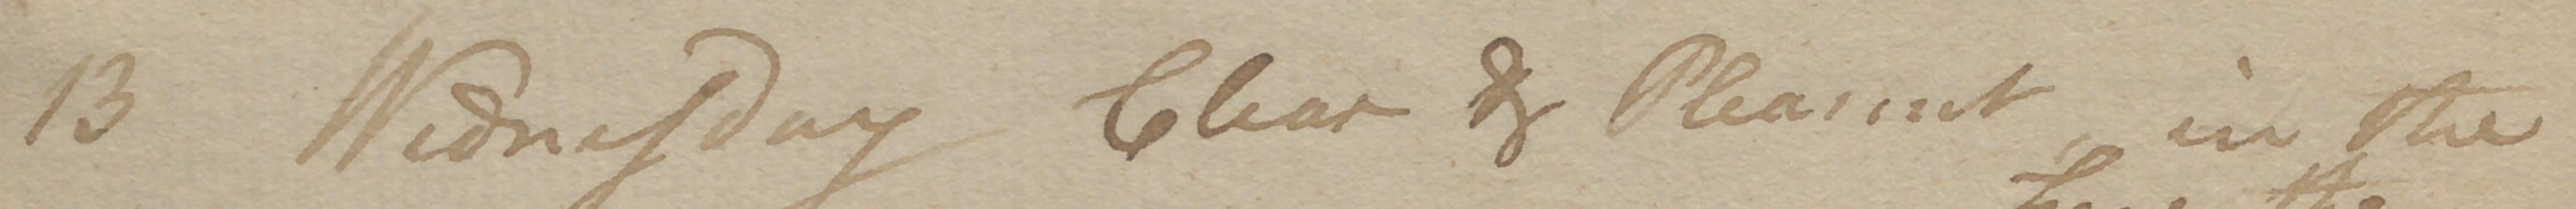13 Wednesday Clear & Pleasent in the
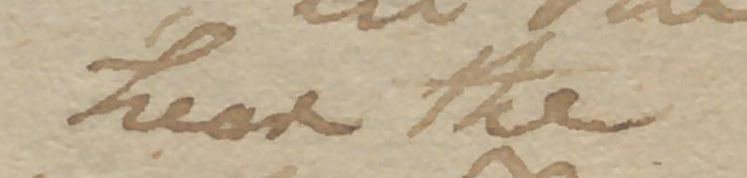hear the
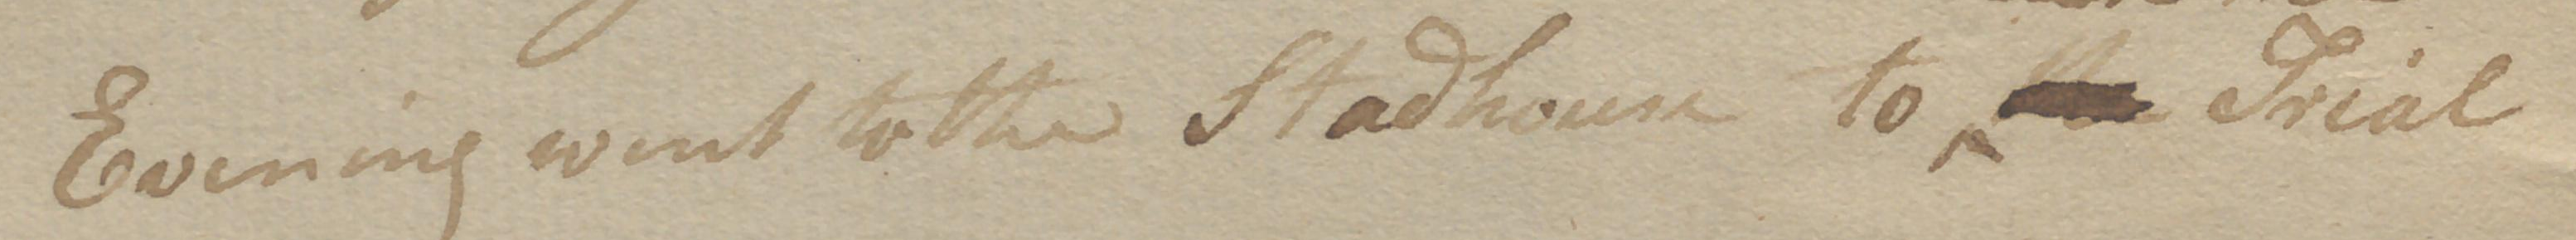Evening went othe Stadhouse to ^ [the] Trial
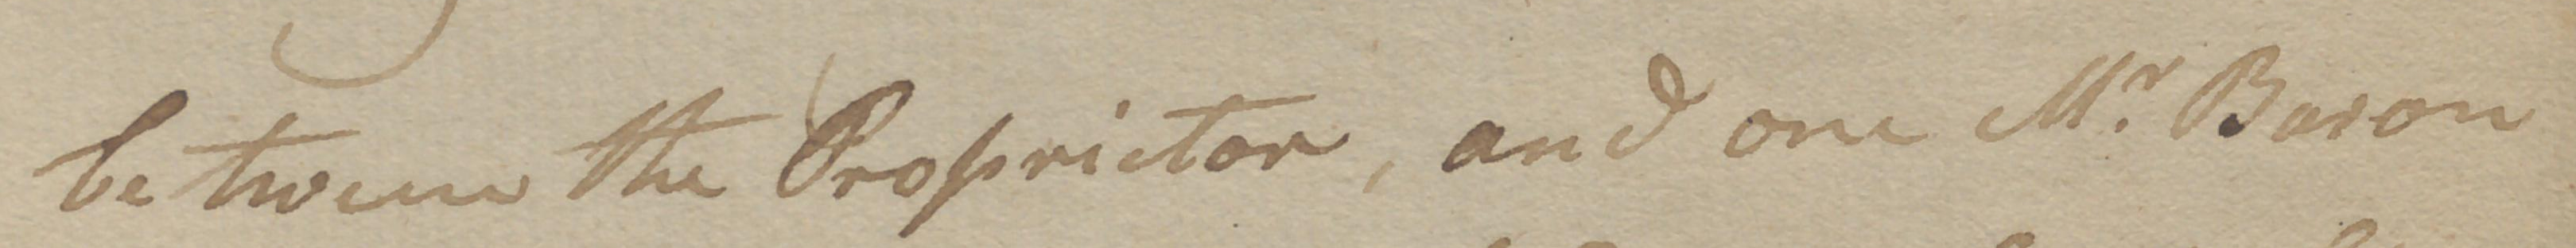between the Proprietor, and one M^r. Baron
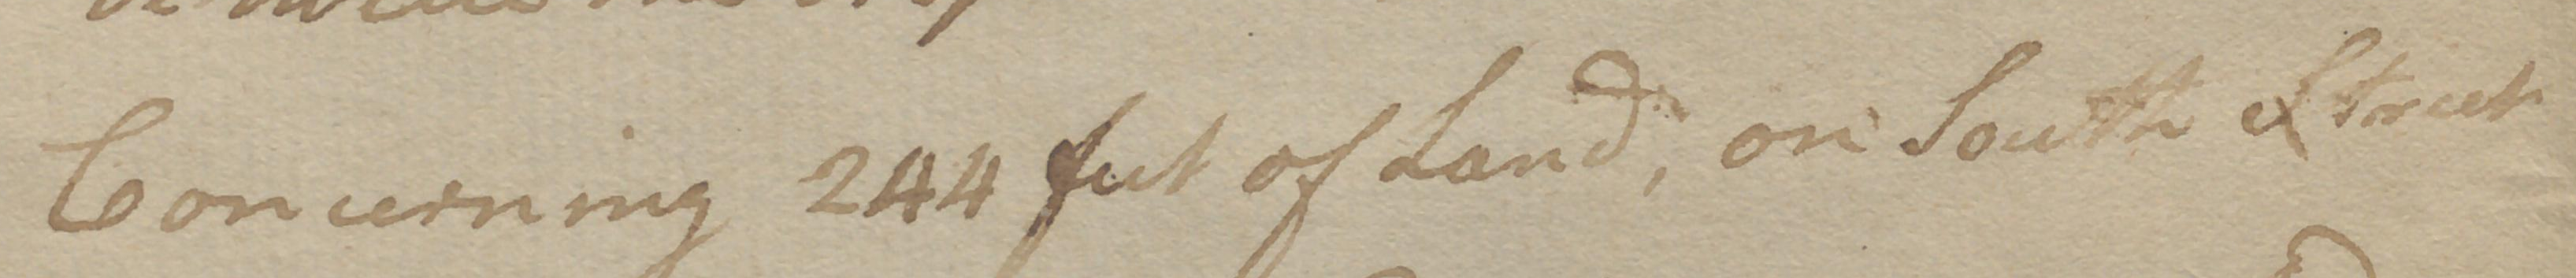Concerning 244 feet of Land, on South Street
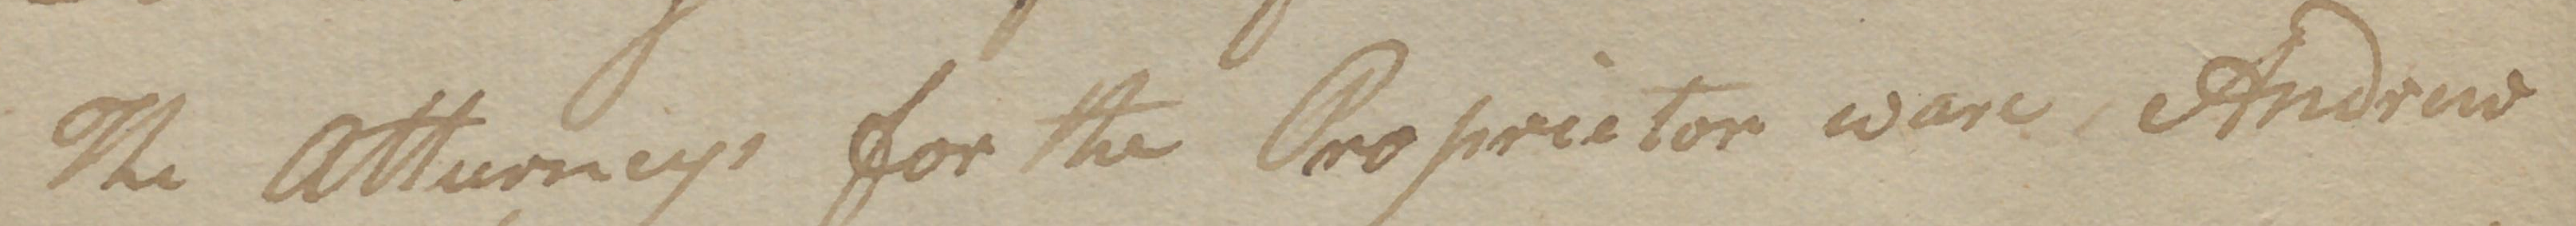The Atturneys for the Proprietor ware Andrew
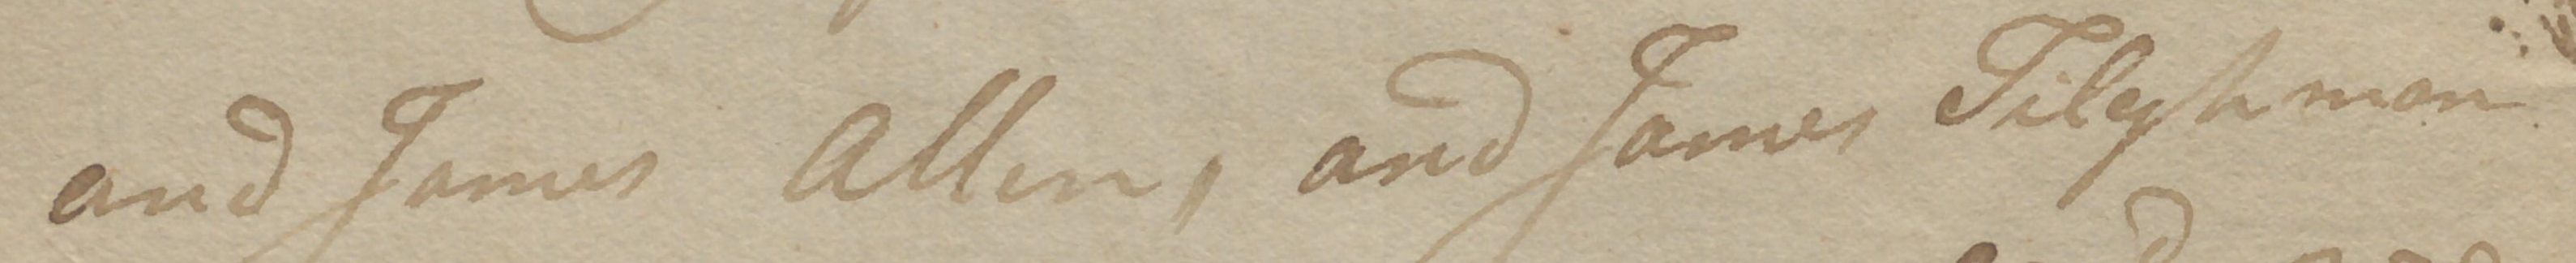and James Allen, and James Tilghman
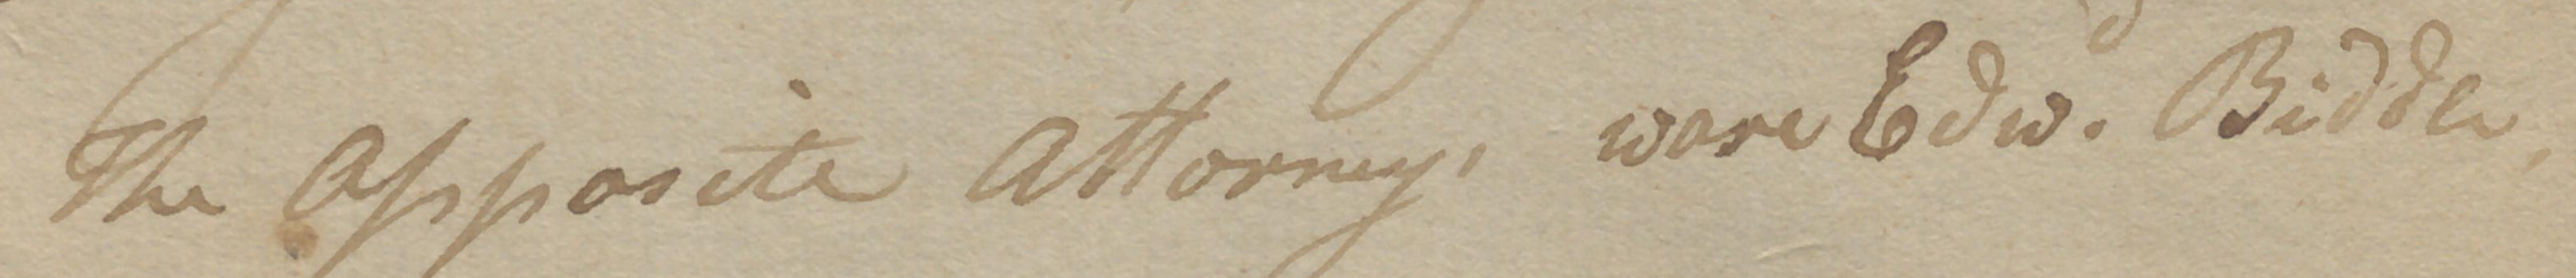The Opposite Attorneys ware Edw^d. Biddle
